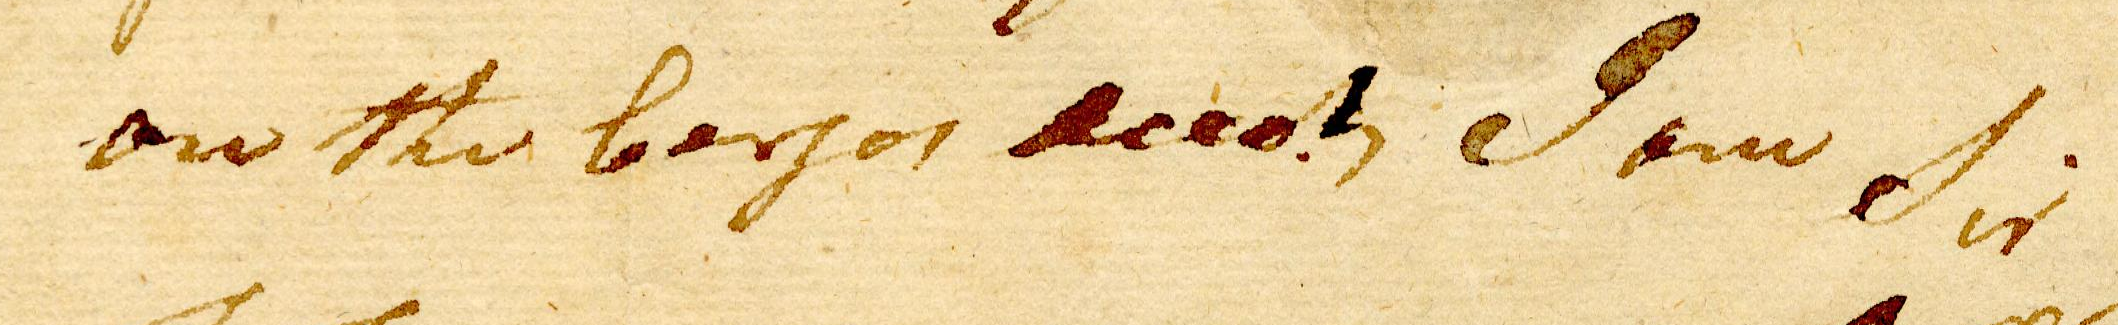on the cargos acco^t. I am sir
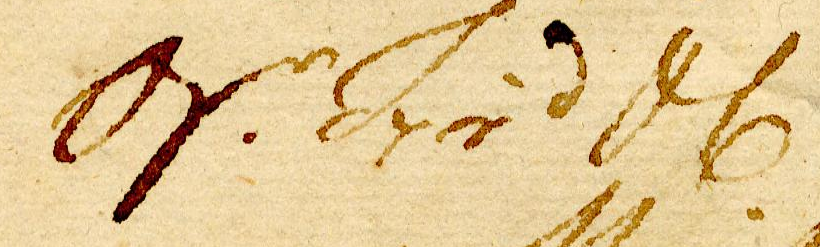Of Fri^d &C
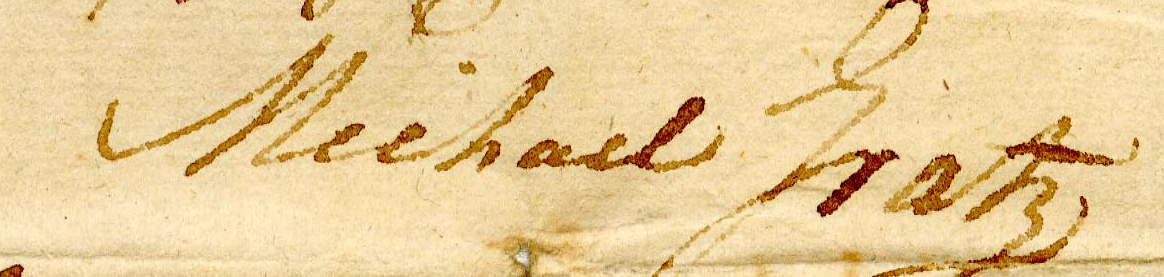Michael Gratz
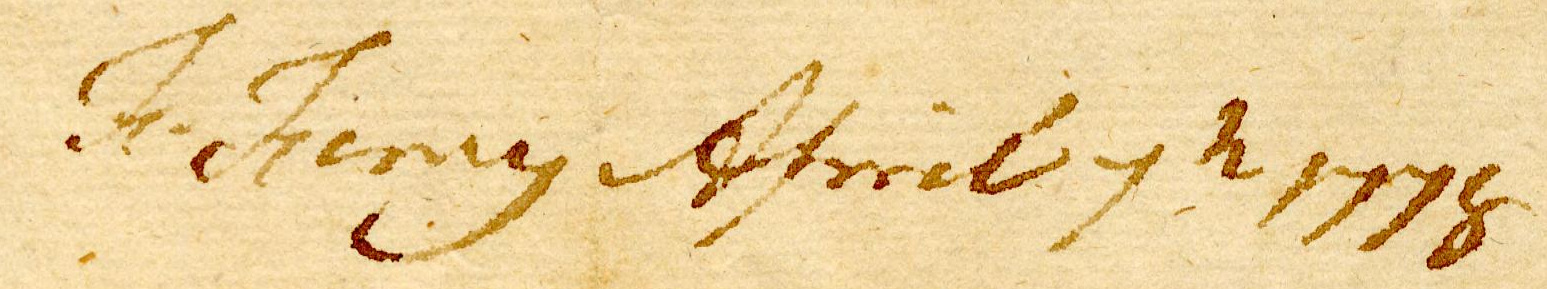F. Ferry April 7^h 1778
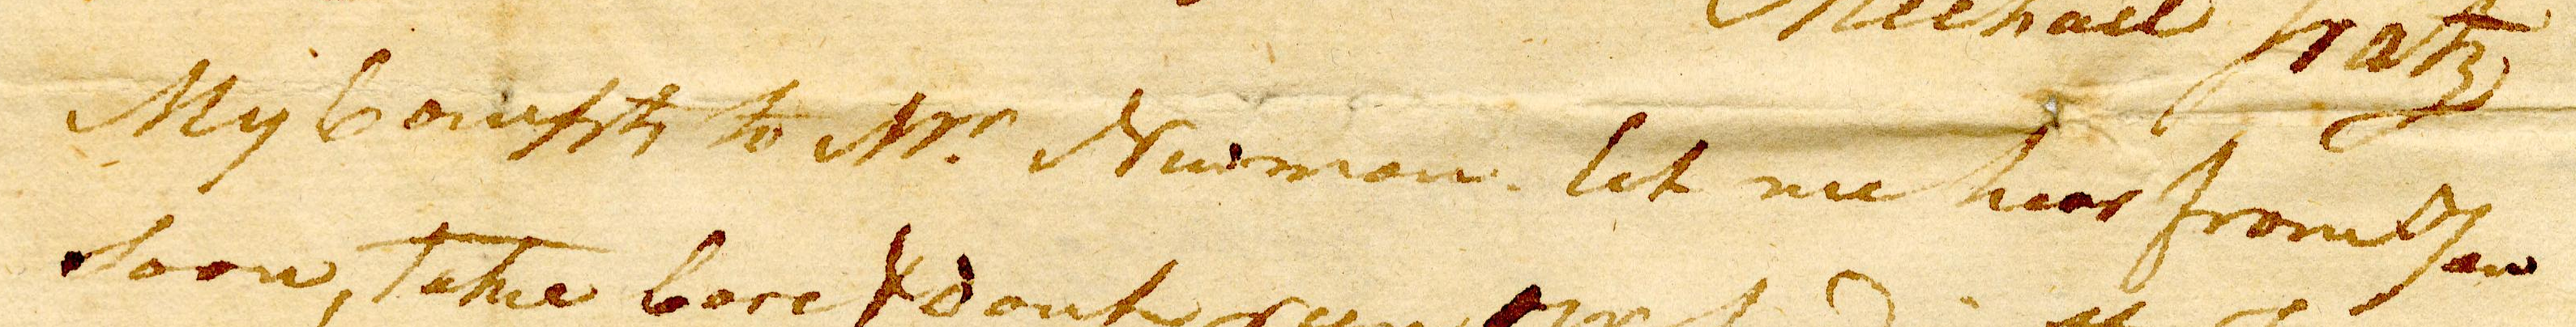My compt^s to M^r. Newman let me hear from you
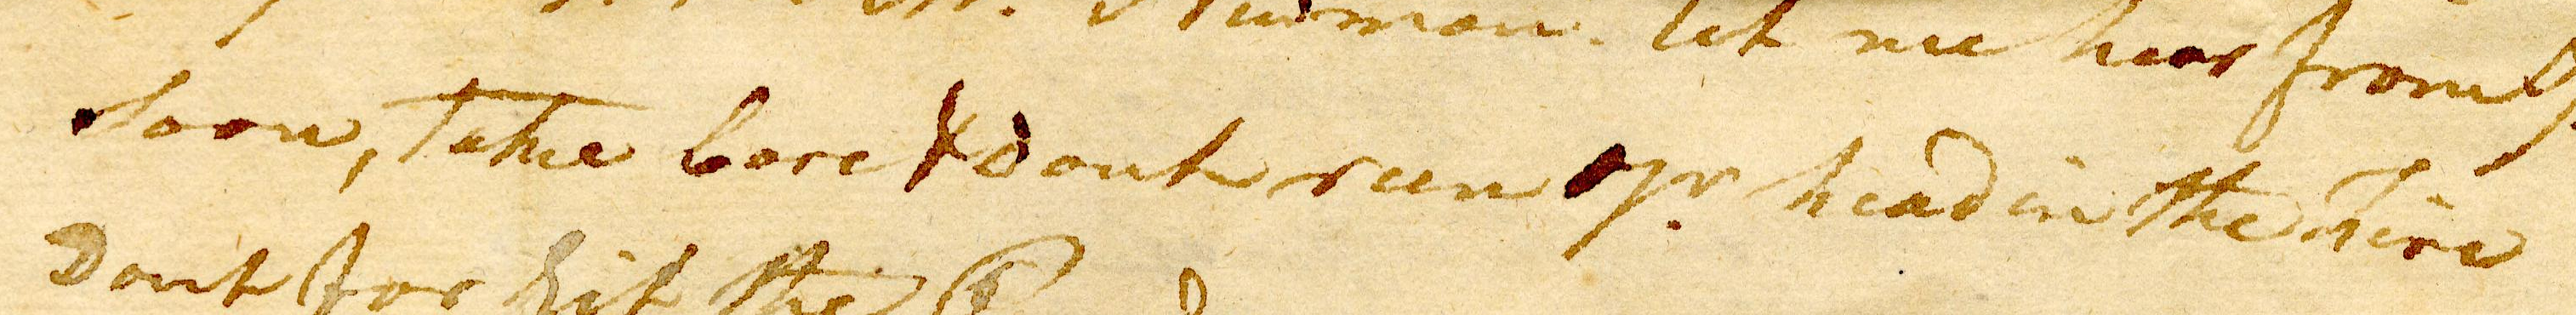soon, take Care & dont run y^r. head in the Fire
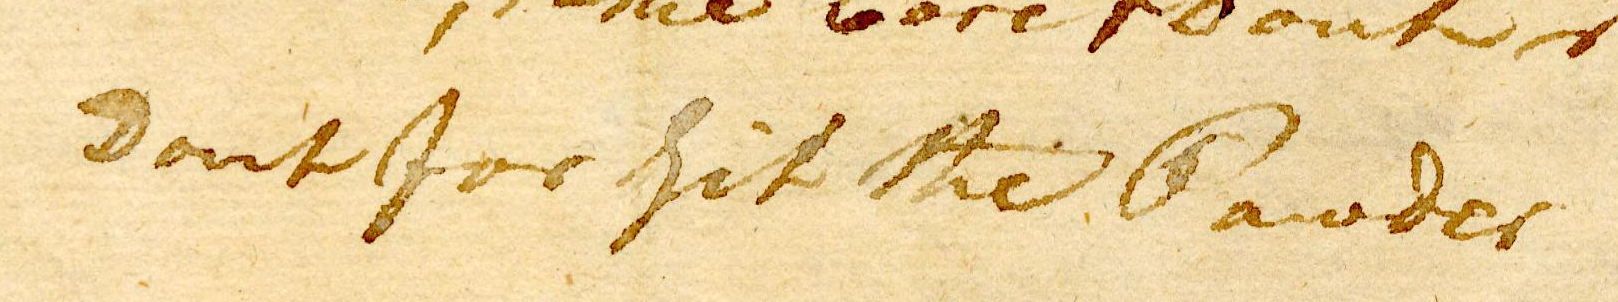Dont for git the Powder
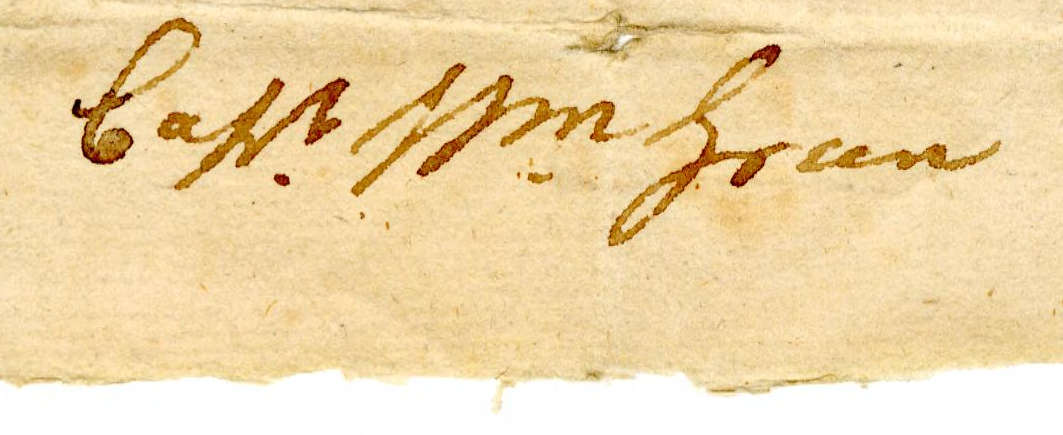Cap^t W^m Green
